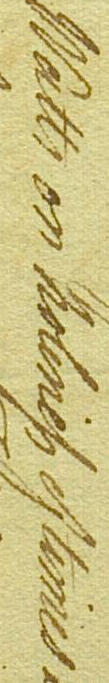Watts on holiness of times &c
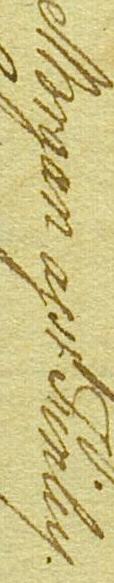Morgan agst Finley.
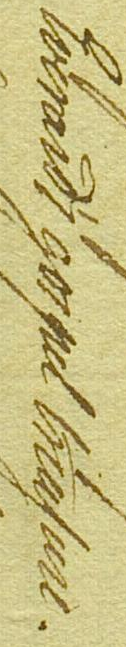Everard's gospel treasure.
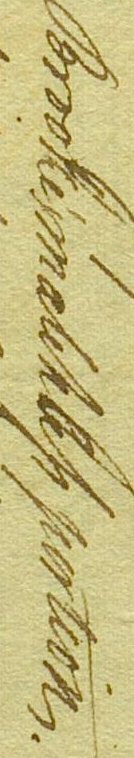Brooke's mabeleless portion.
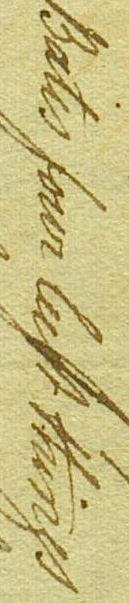Bates four last things
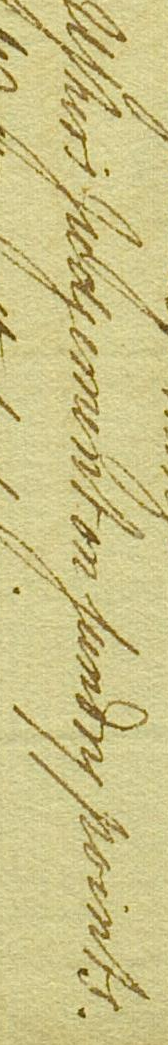Usher's Judgement on Sundry points.
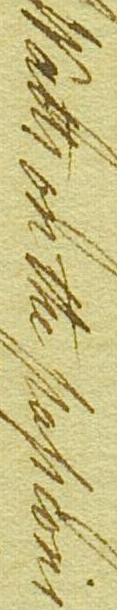Watts on the passions
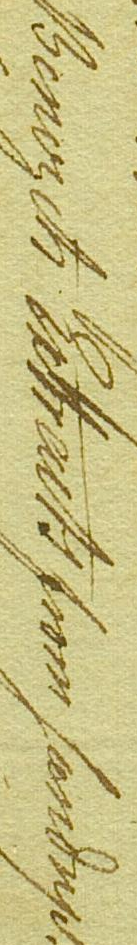Benezets Extracts from Sandrys.
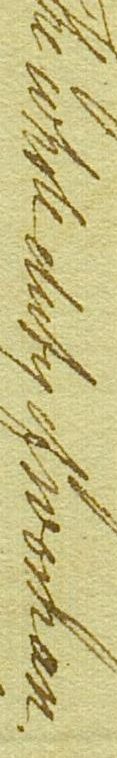The whole duty of woman.
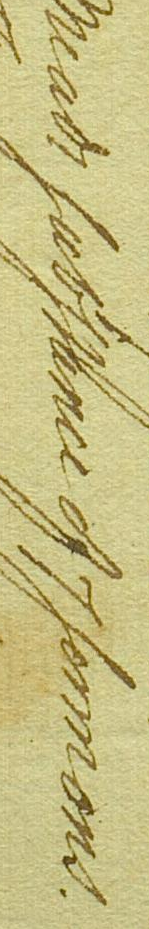Meads substance of 7 sermons.
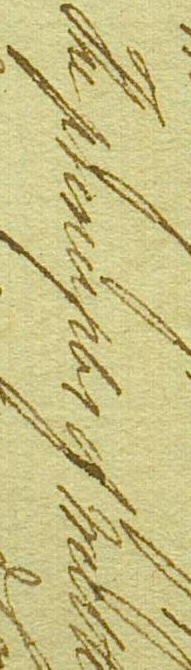The prenupbs of wrath
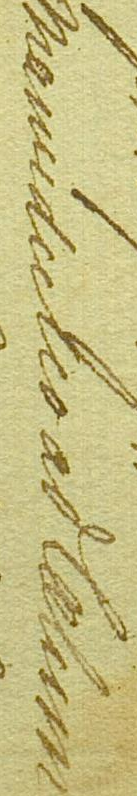Mauridceleo ad Caelum
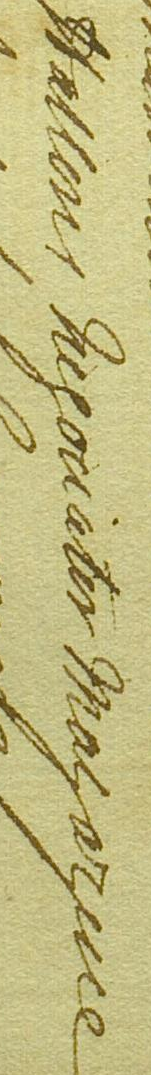Hallons Negociator Magazine
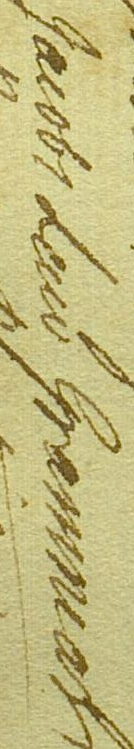Jacobs Law Grammar
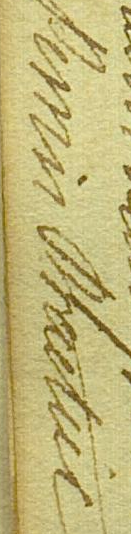Penn's Practice
